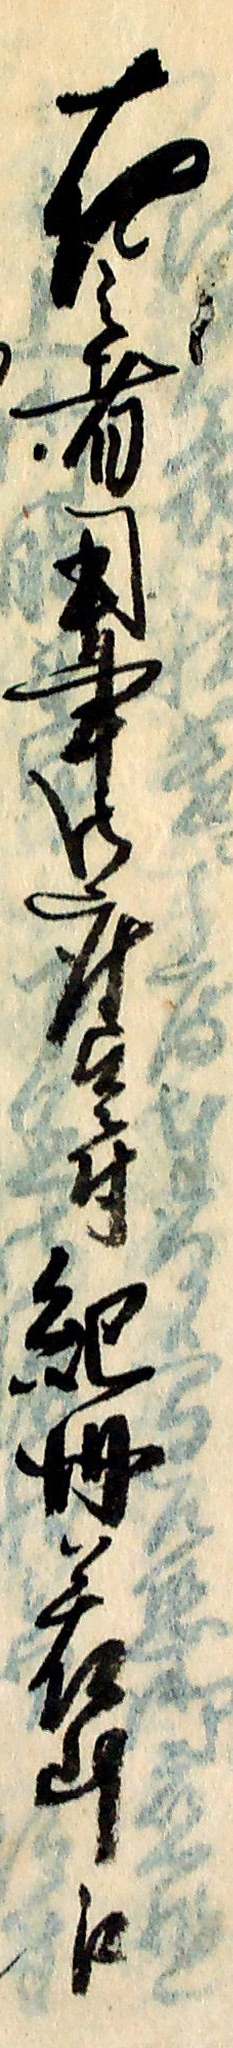右之者用事御座候に付紀州若山え
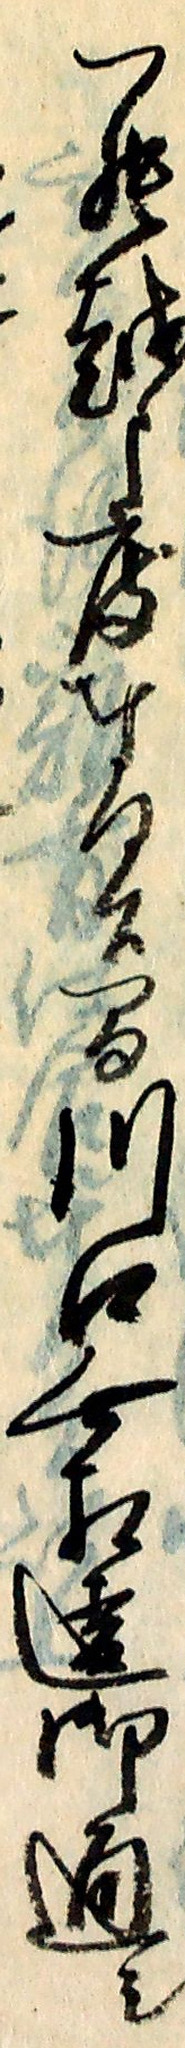罷越申度奉存候間川口無相違御通し
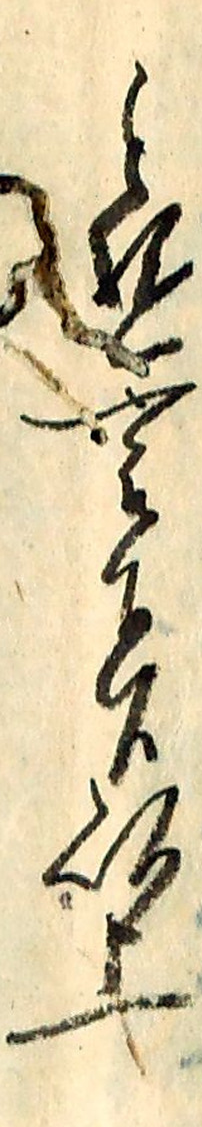被遊可被下候以上
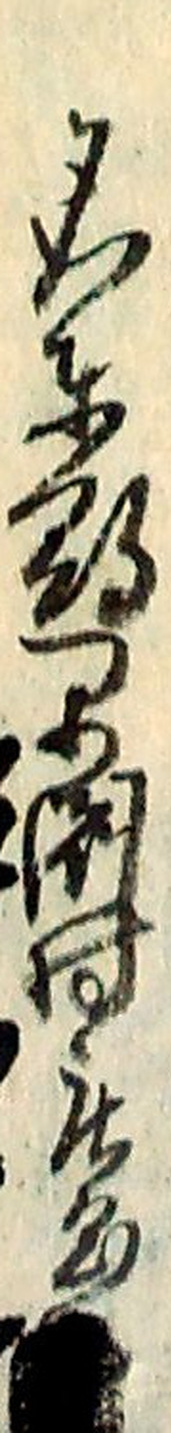名東郡早淵村庄屋
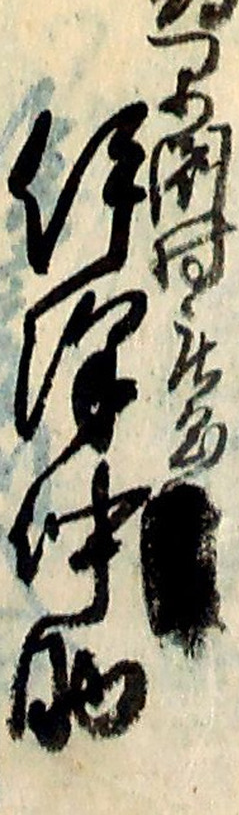伊沢仲助
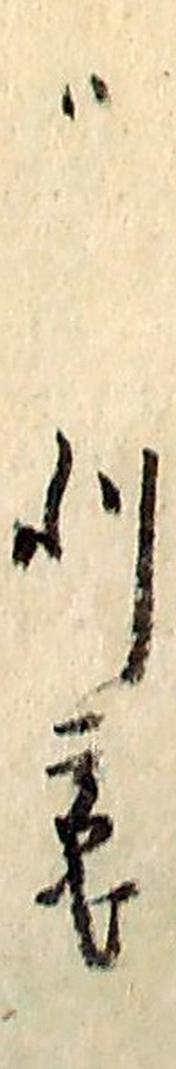与三郎
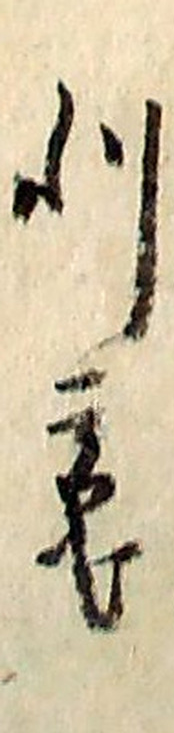利兵衛

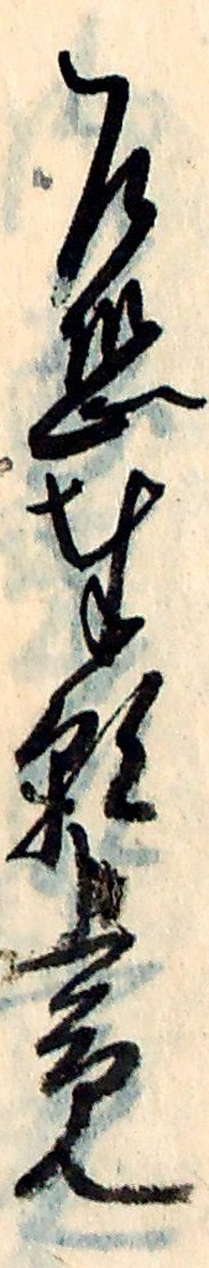乍恐奉願上覚
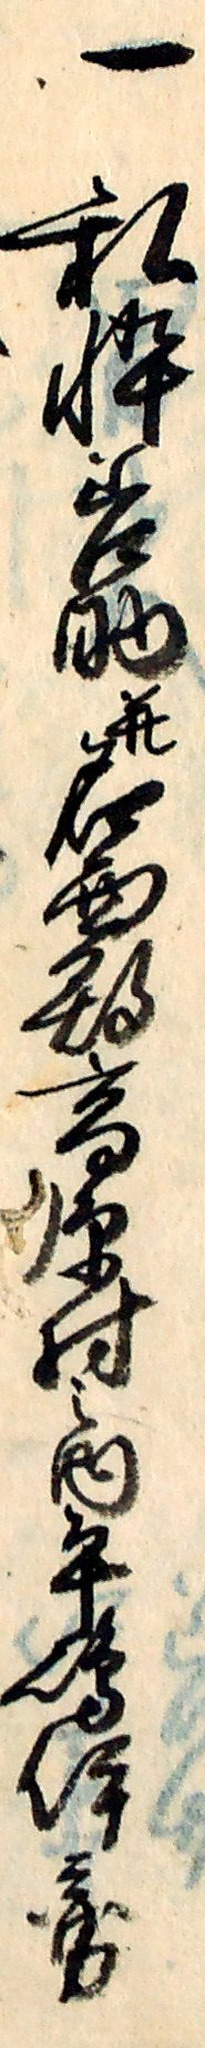一私倅善助并名西郡高原村之内平島伊兵衛
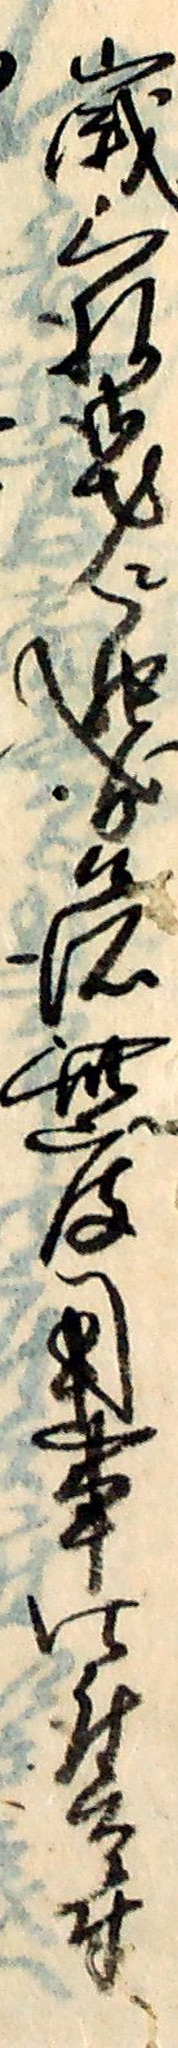歳三拾弐才に罷成候所此度用事御座候に付
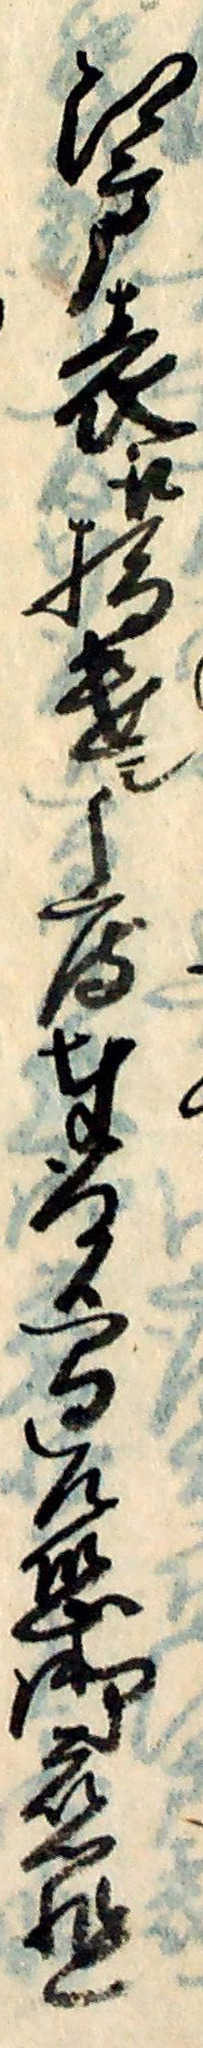江戸表え指遣し申度奉存候間乍恐御慈悲
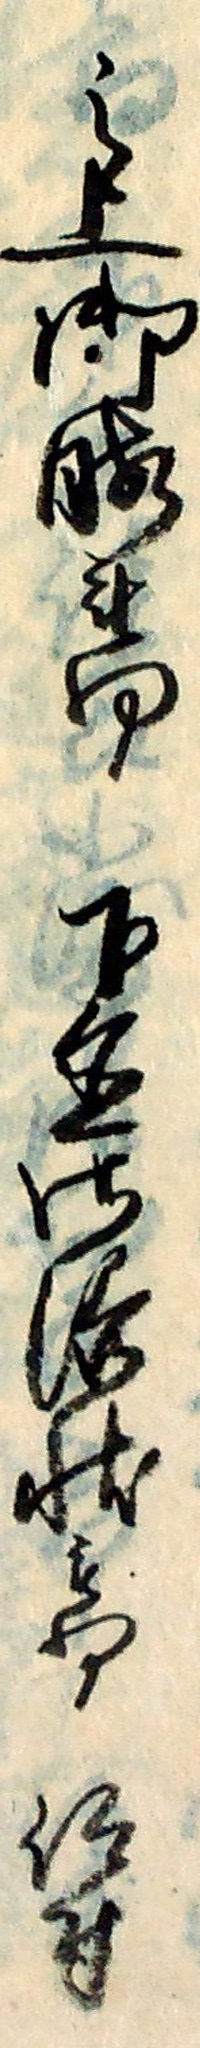之上御暇被為下置御添状被為仰付
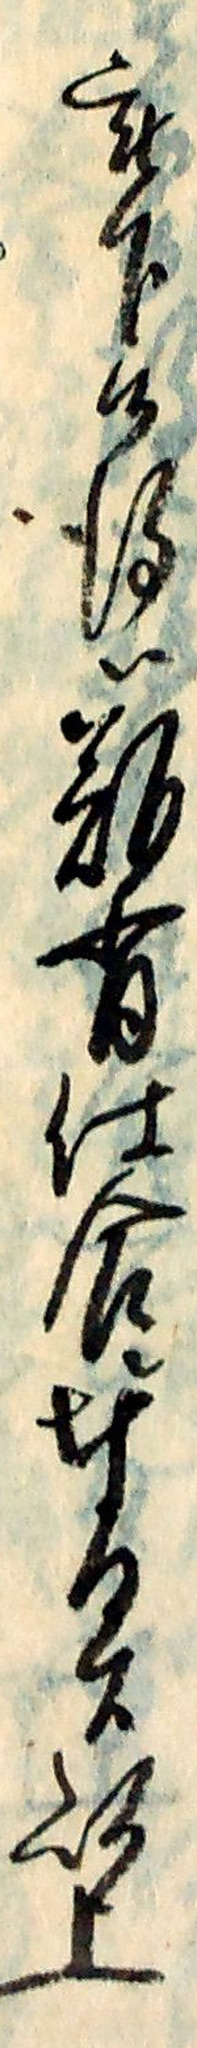被下候得は難有仕合に奉存候以上
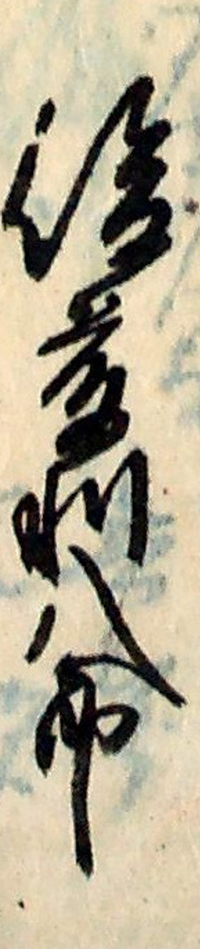後藤利八郎
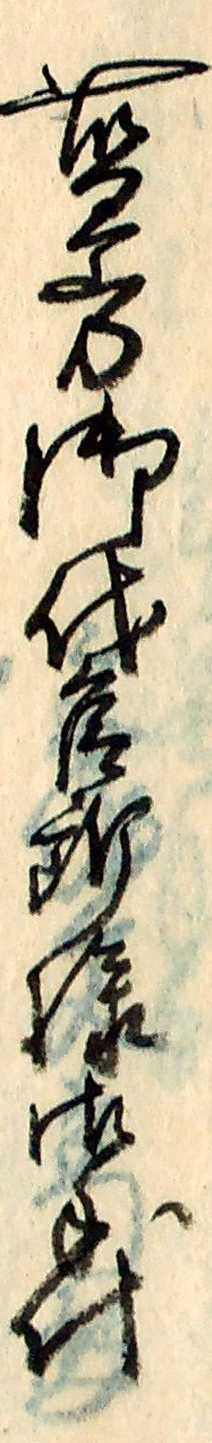藍方御代官所様御手代
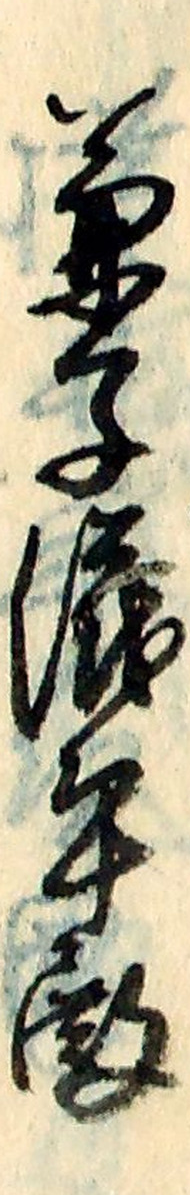兼子儀平殿
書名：諸御願書控(後藤氏壱番）
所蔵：鳴門教育大学 Naruto University of Education
